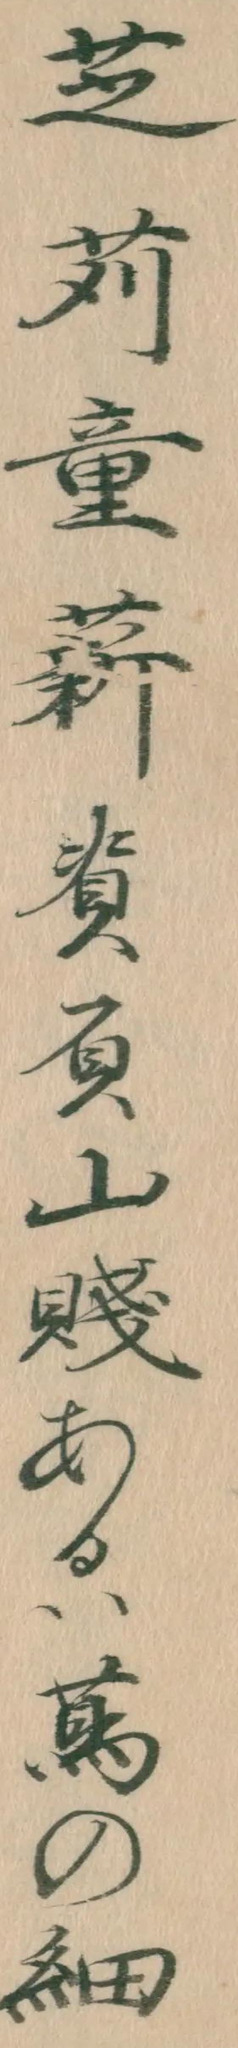芝苅童薪背負山賎あるは蔦の細
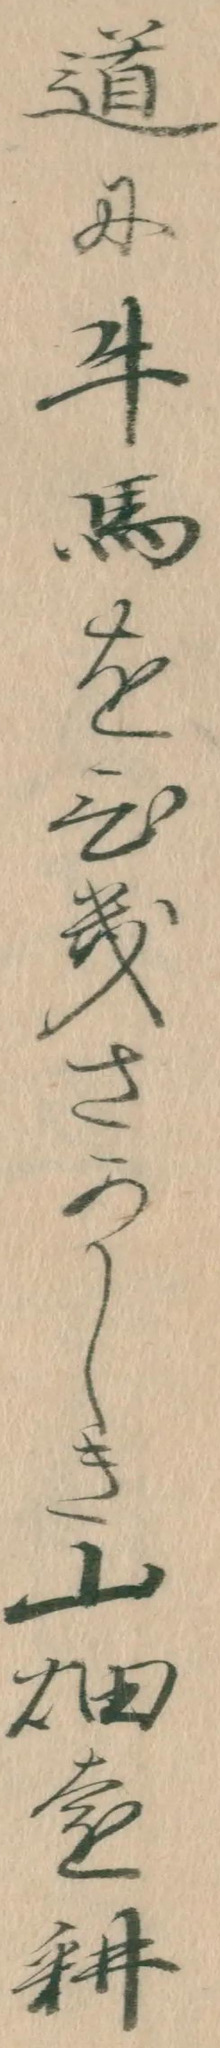道に牛馬をひきさかしき山畑を耕
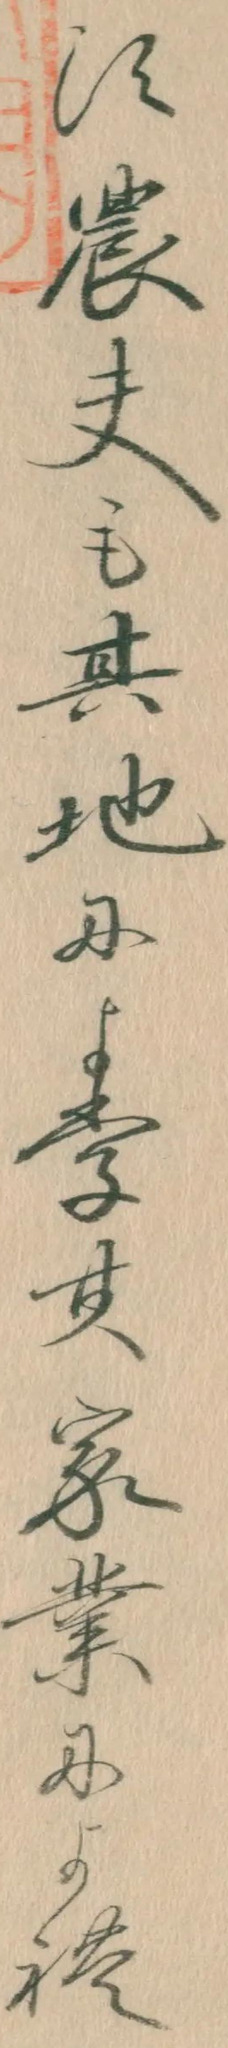す農夫も其地により其家業によれ
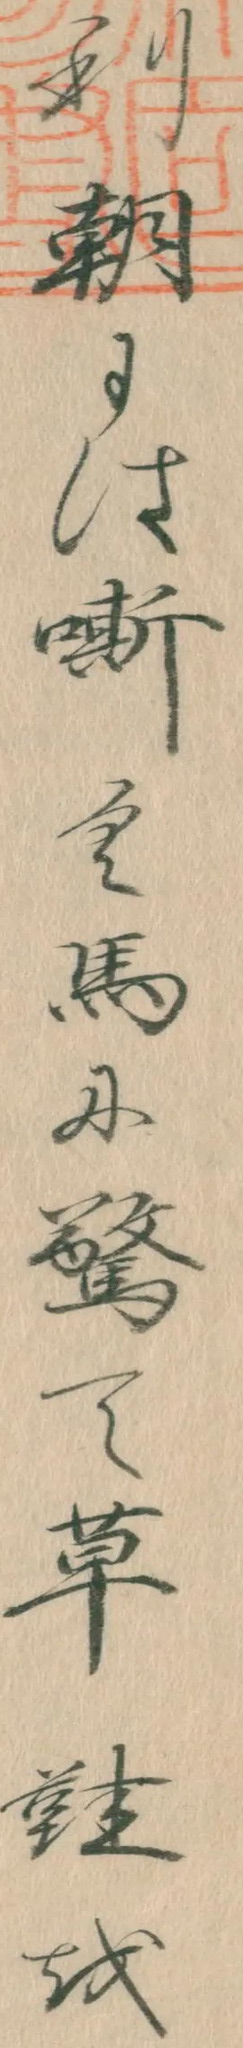り朝には嘶く馬に驚て草鞋を
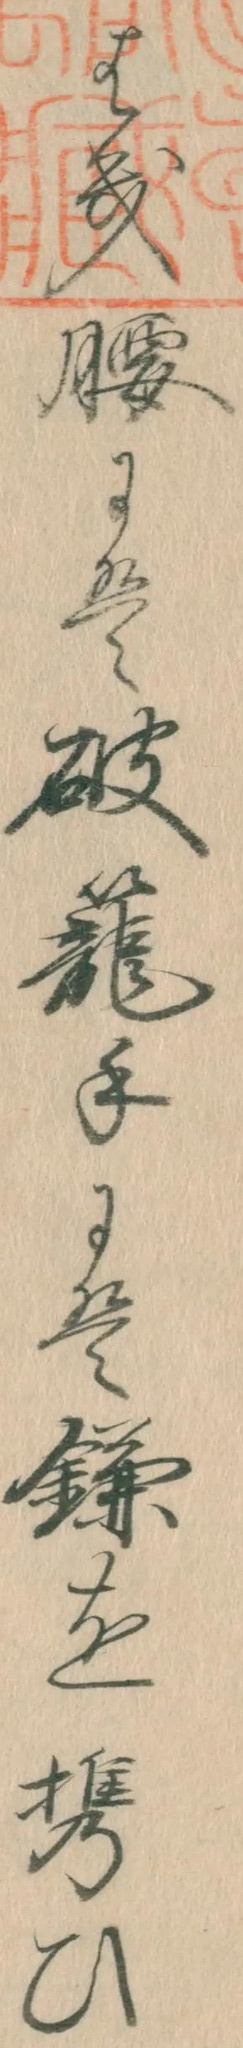はき腰には破籠手には鎌を携ひ
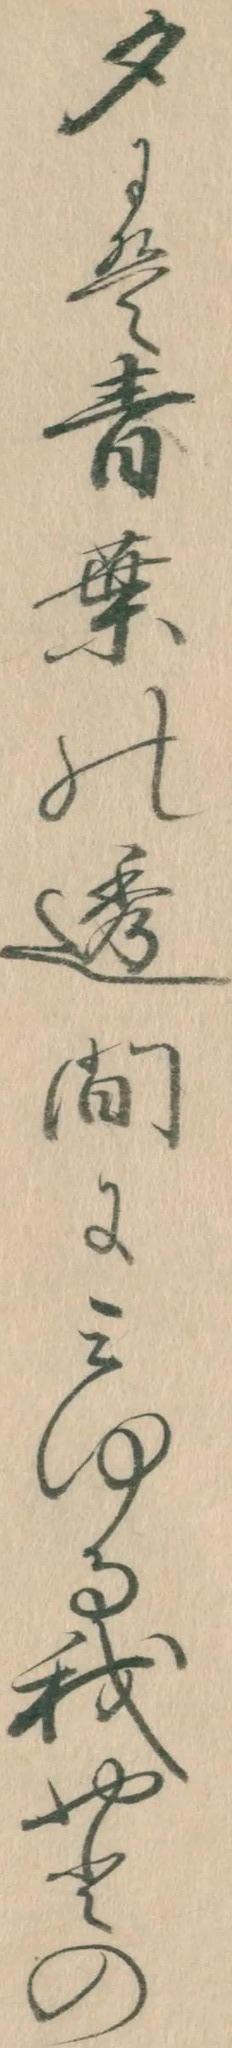夕には青葉の透間にみゆる我やとの
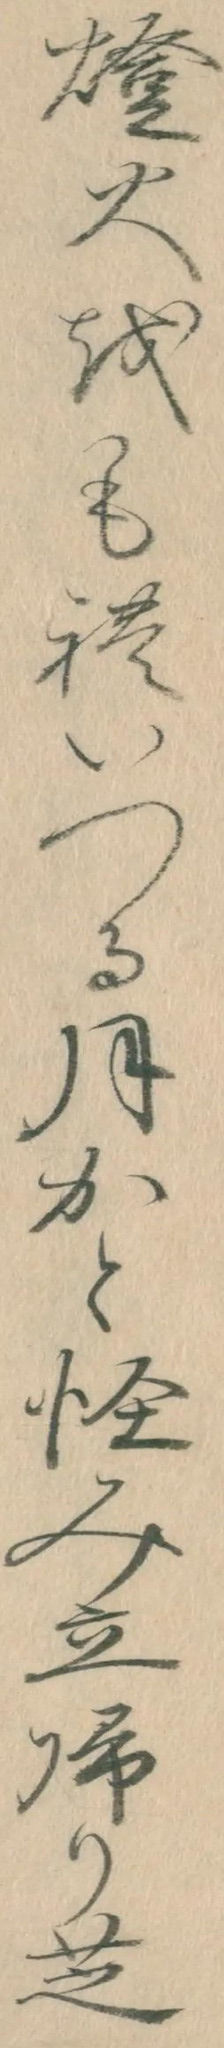燈火をもれいつる月かと怪み立帰り芝

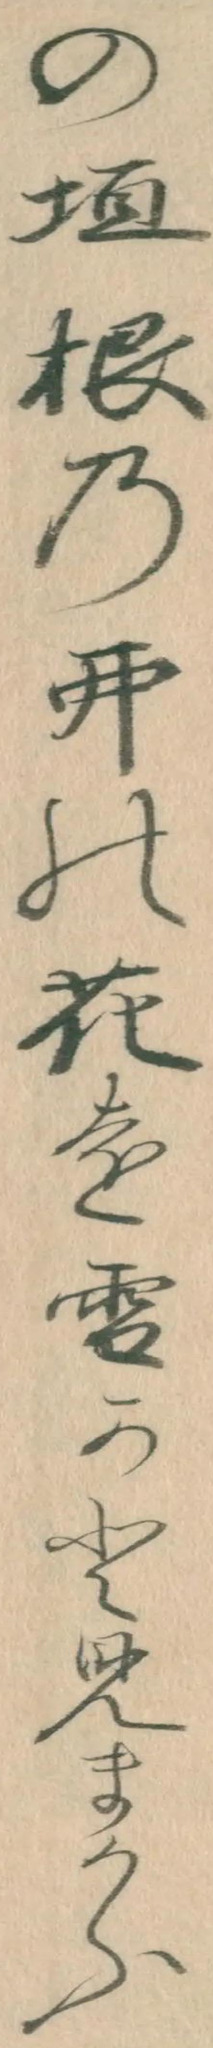の垣根の卯の花を雪かと見まかふ
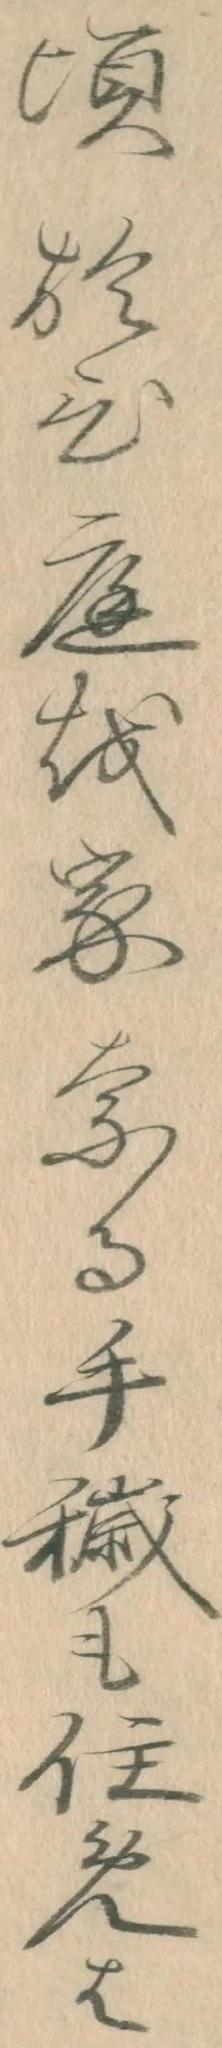比おひ庭を家なる手穢も住めは
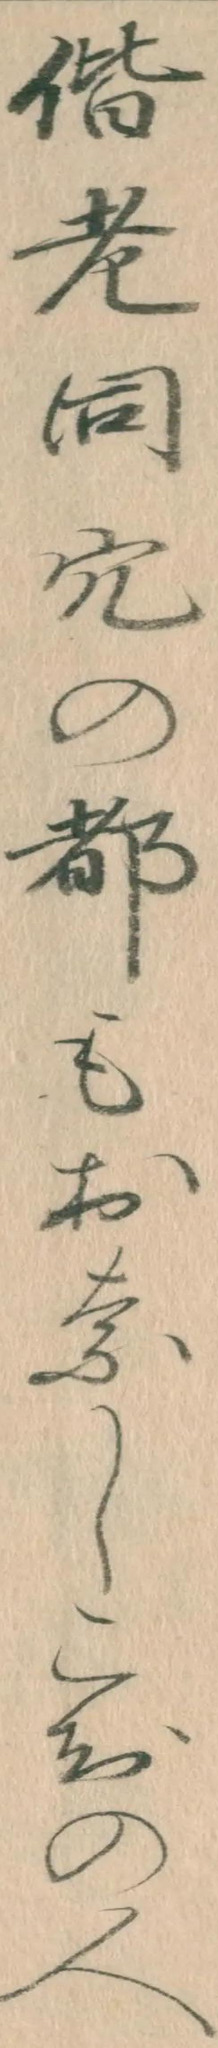偕老同穴の都もおなしこちの人
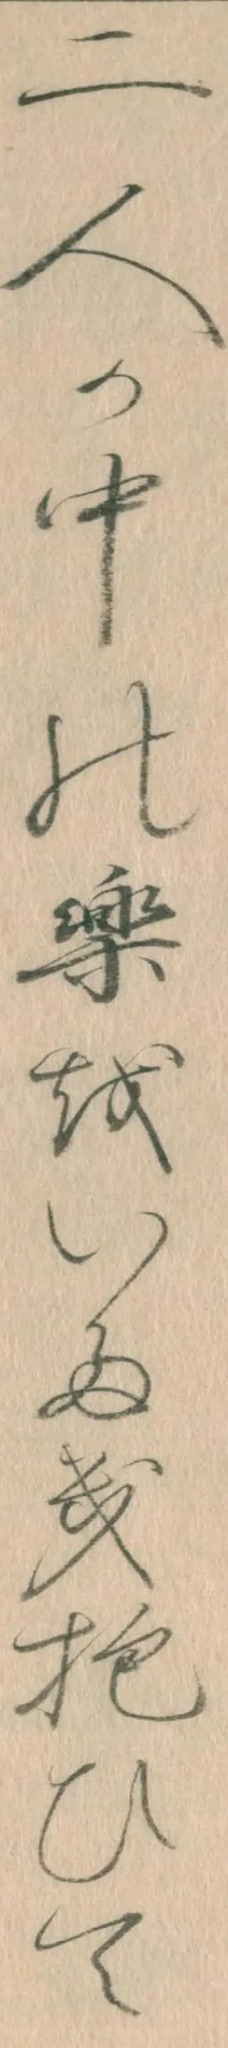二人か中の楽をいたき抱ひて
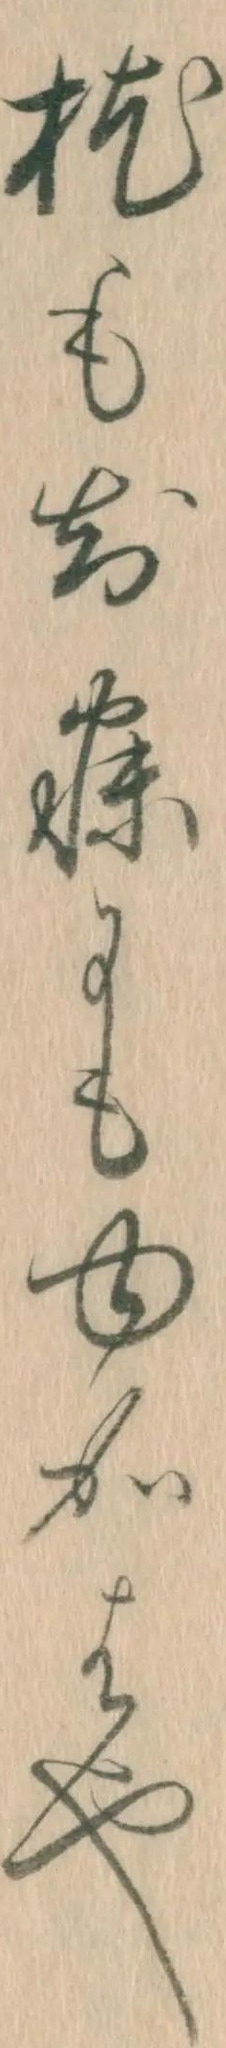枕もち寝にもゆかはや
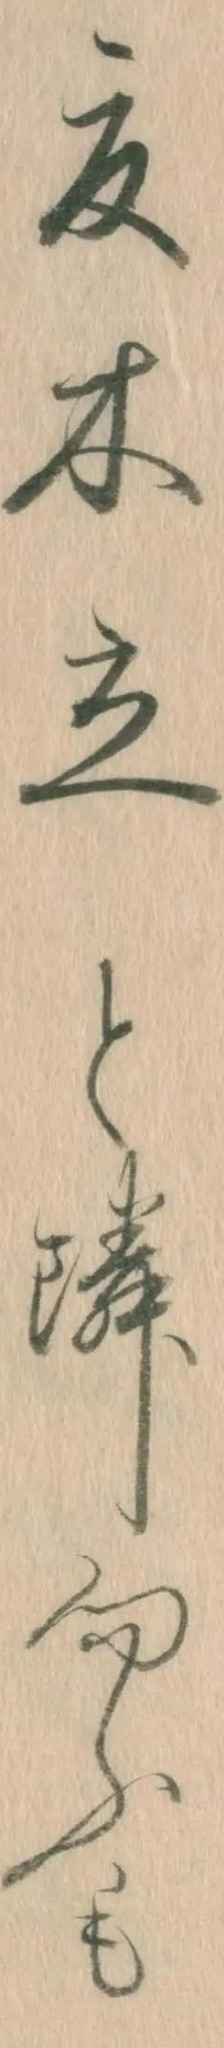夏木立と隣向ふも
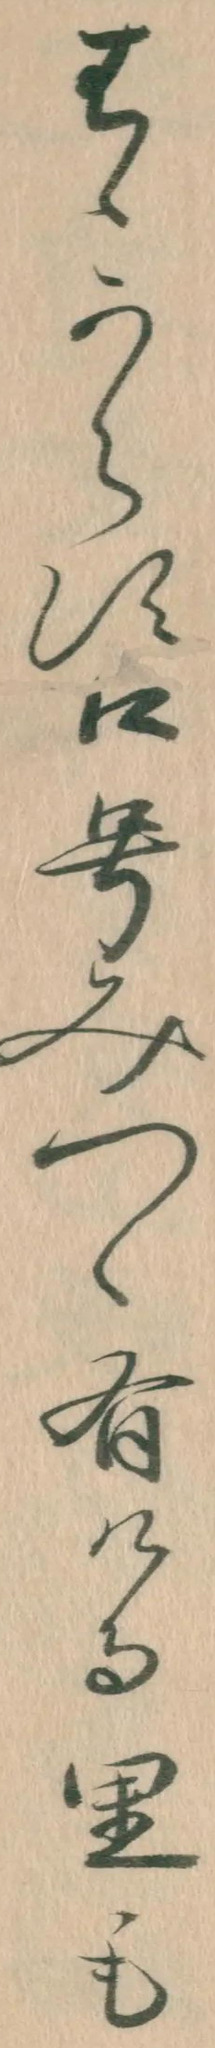はゝからす口号みつゝ有ける里も
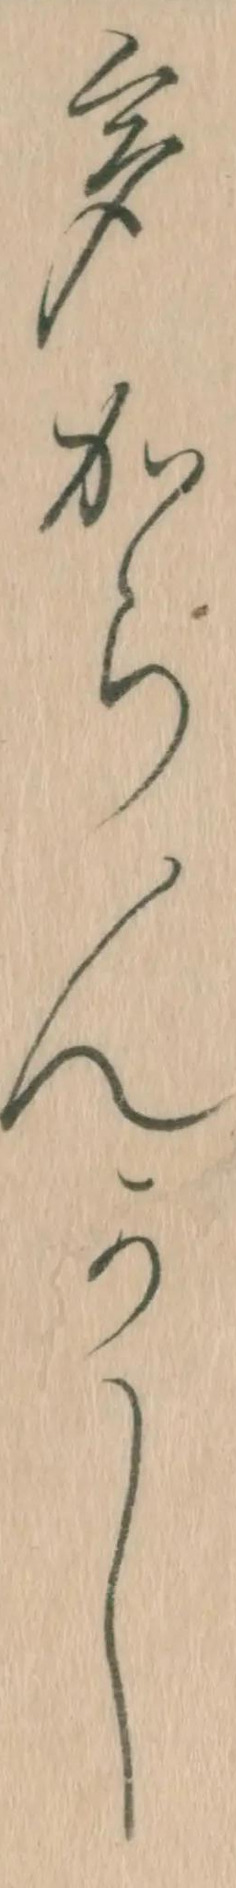多からんかし
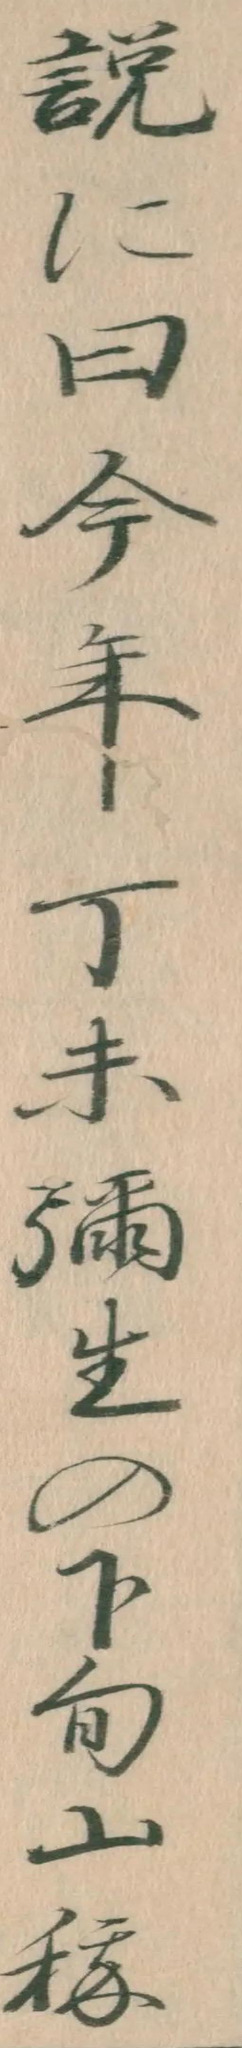説に曰今年丁未弥生の下旬山稼
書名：俗語之種. [6]
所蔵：国立国会図書館 National Diet Library, JAPAN
